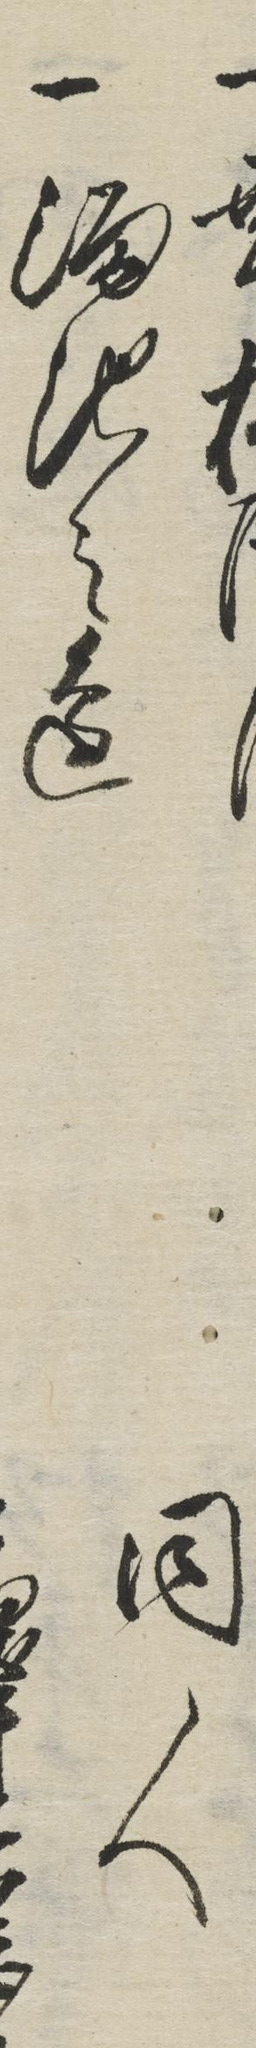一溜池之辺同人
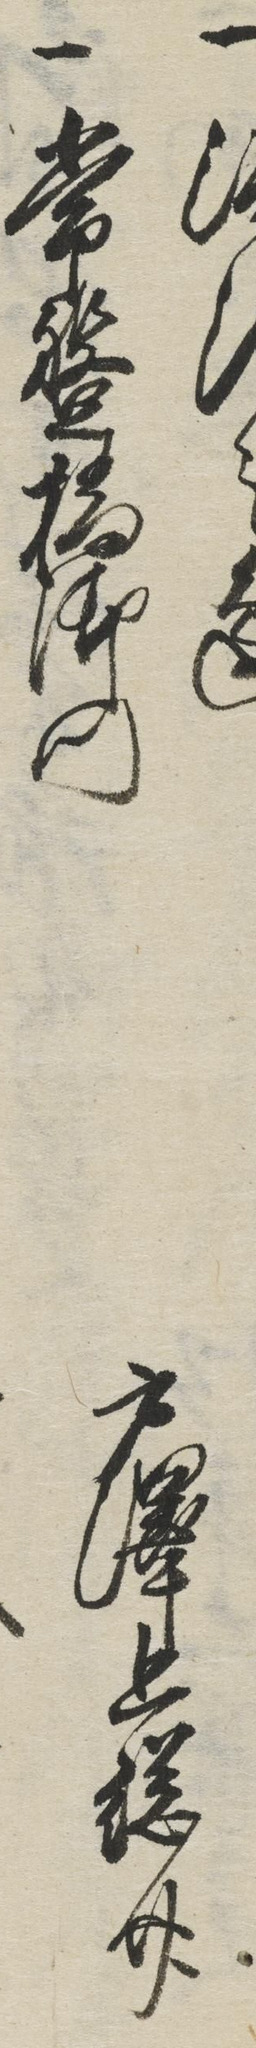一常盤橋御門戸澤上総介
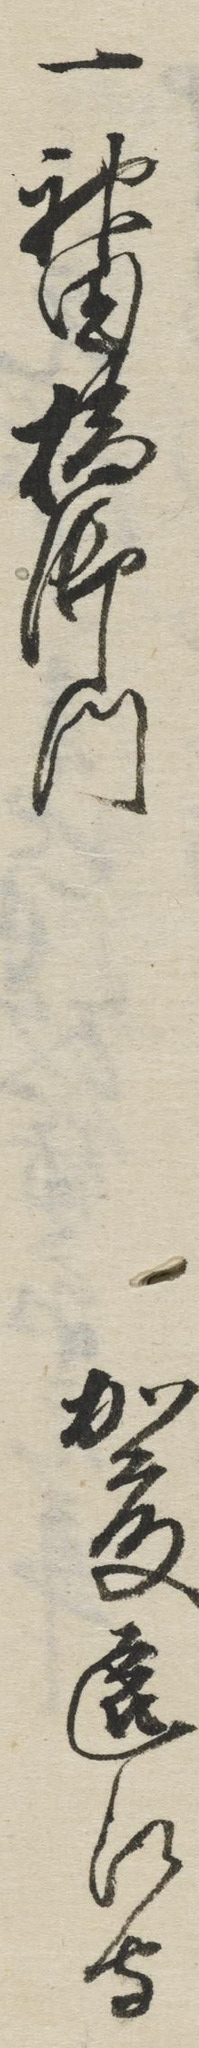一神田橋御門加藤遠江守
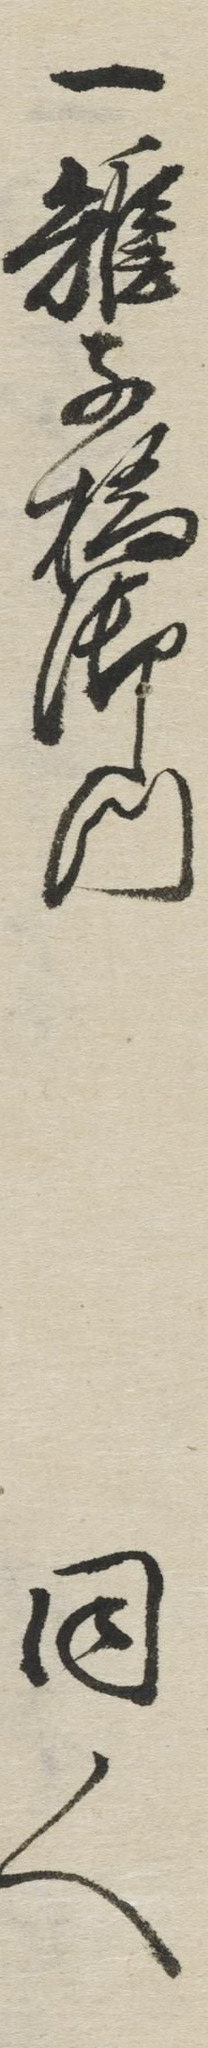一雉子橋御門同人
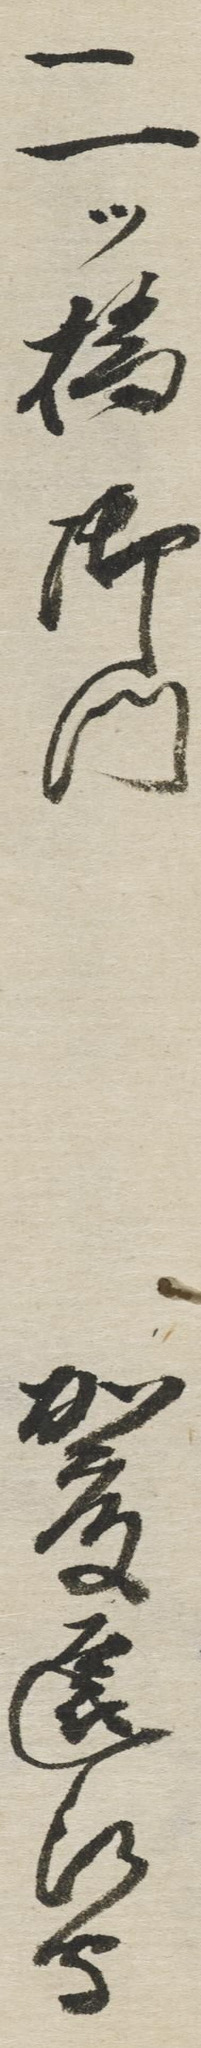一一ッ橋御門加藤遠江守
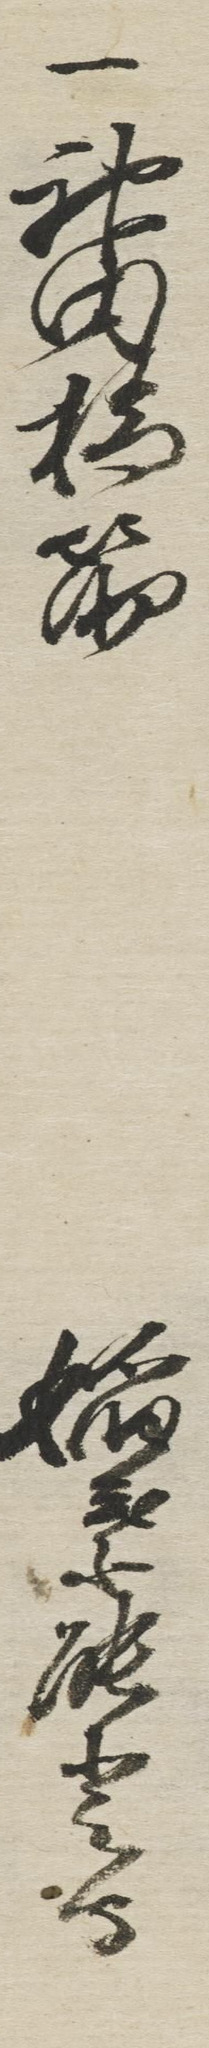一神田橋筋稲葉能登守
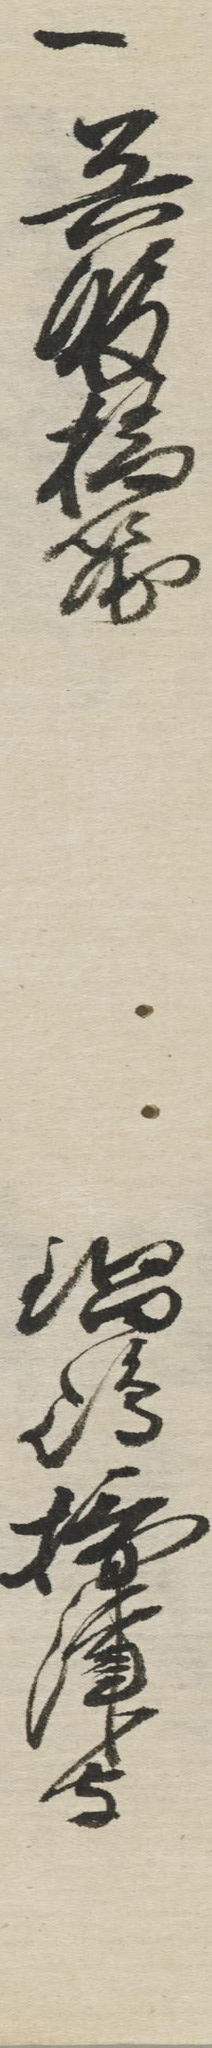一呉服橋筋鍋嶋播磨守
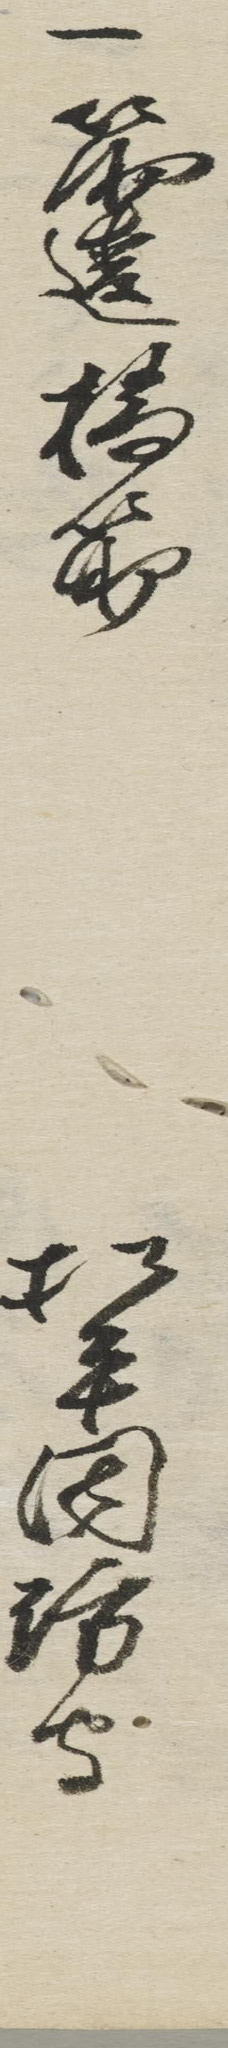一筋違橋筋松平周防守
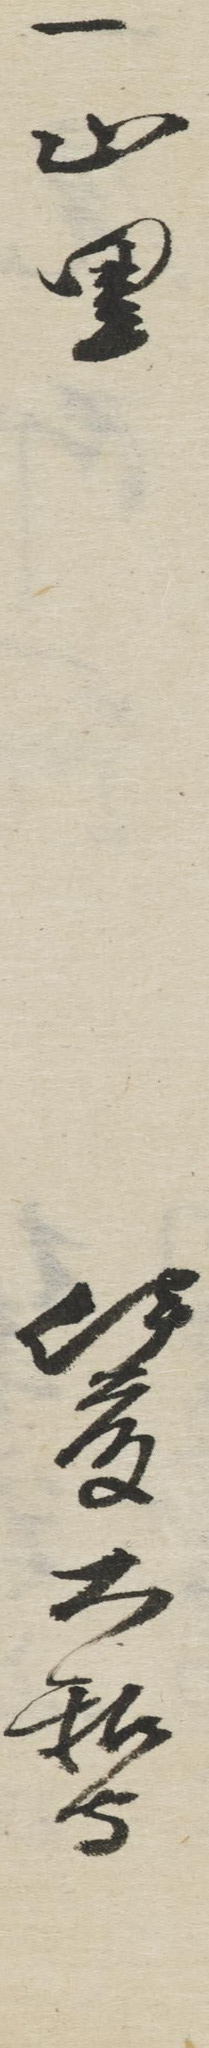一山里伊藤大和守
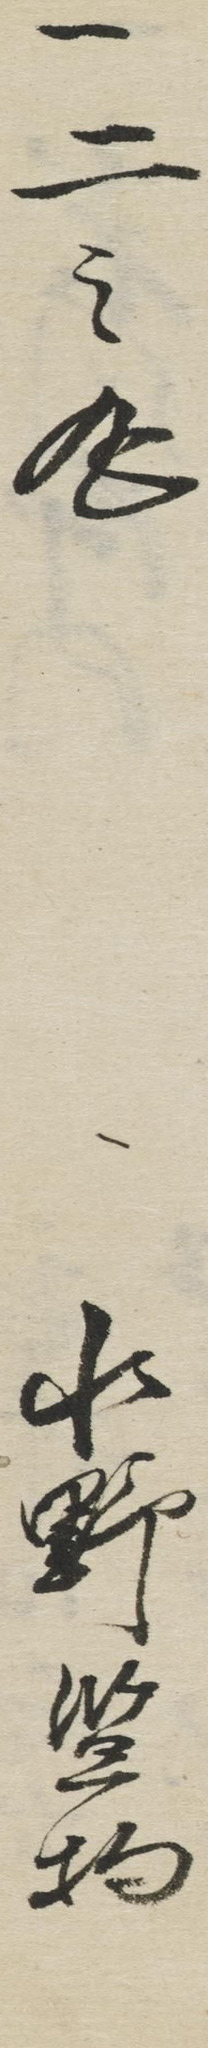一二之丸水野監物
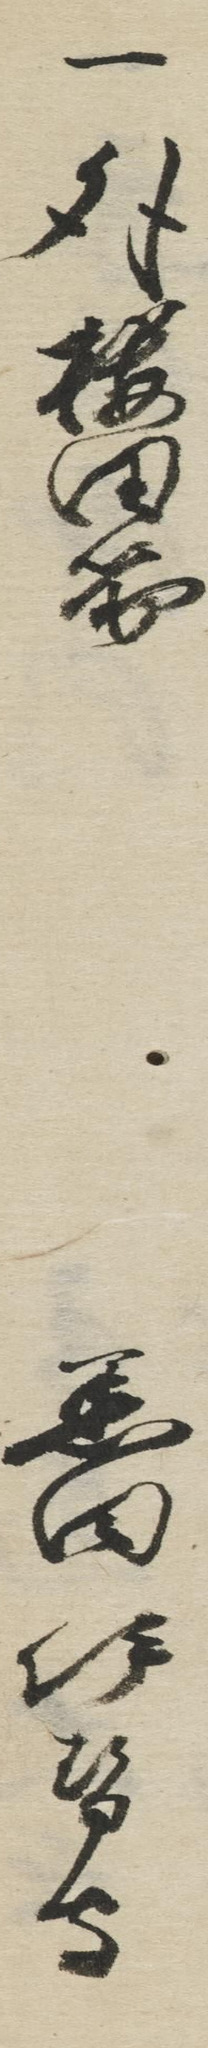一外桜田筋黒田伊勢守

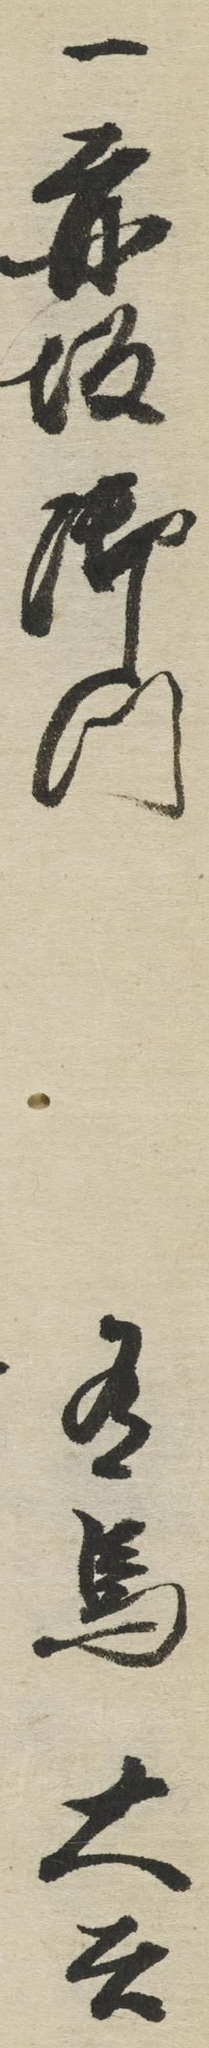一赤坂御門有馬大吉
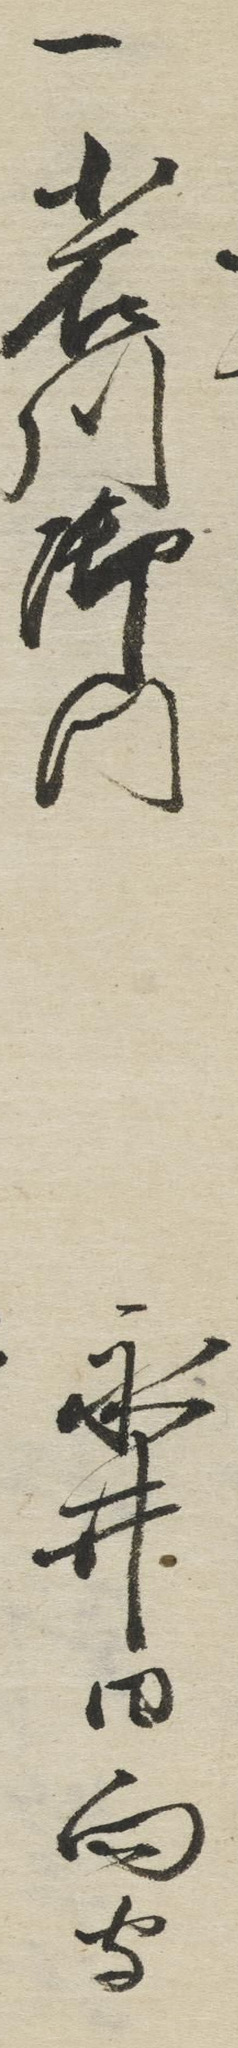一小石川御門永井日向守
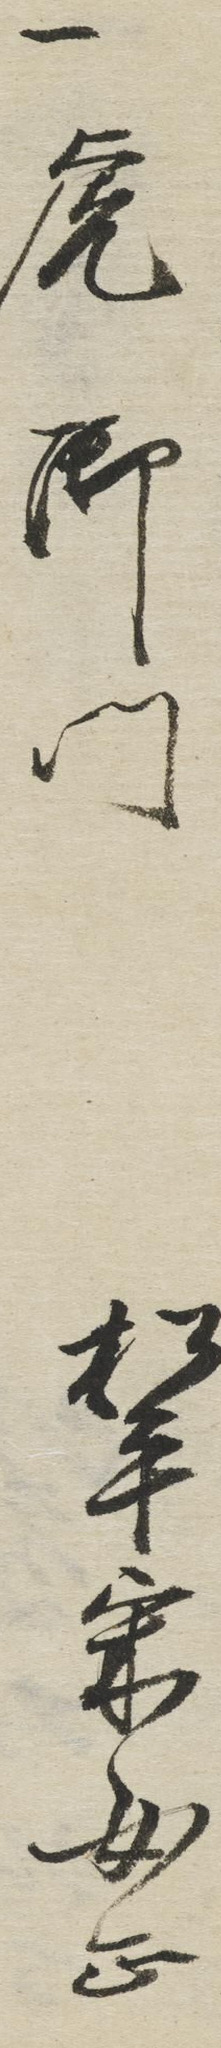一虎御門松平采女正
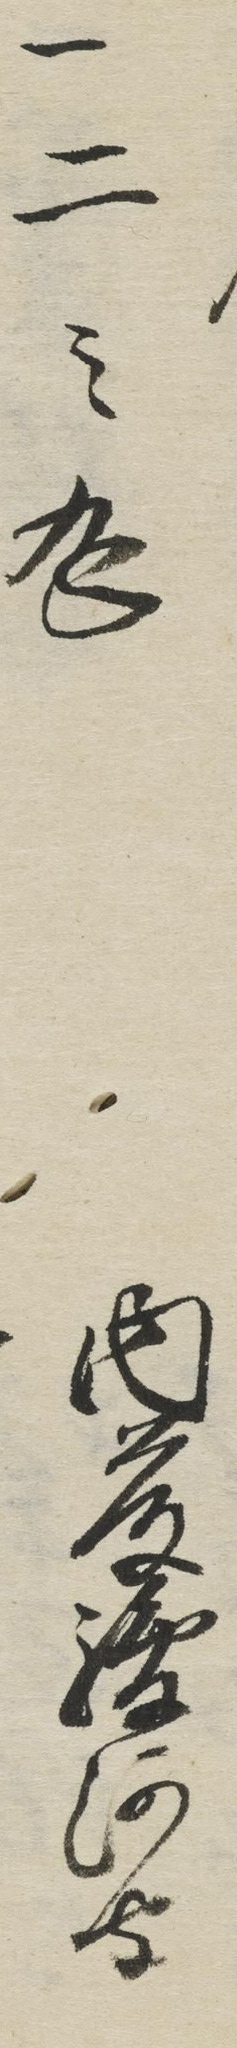一二之丸内藤駿河守
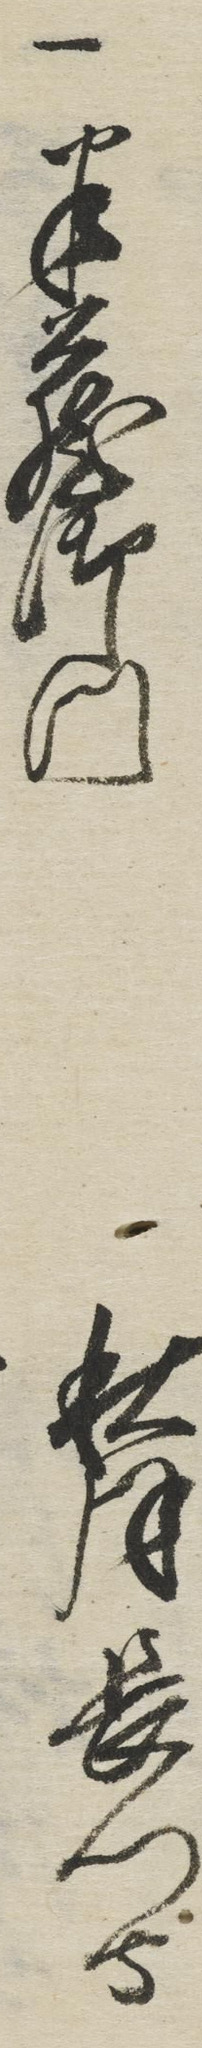一半蔵御門秋月長門守
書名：元禄地震記
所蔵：東京大学地震研究所図書室 Earthquake Research Institute Library, The University of Tokyo, JAPAN
